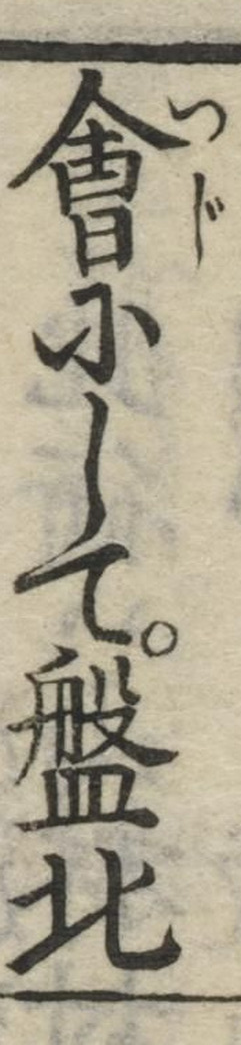会にして。盤北
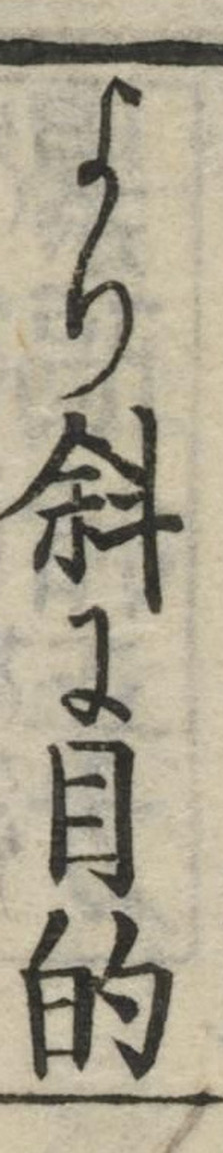より斜に目的
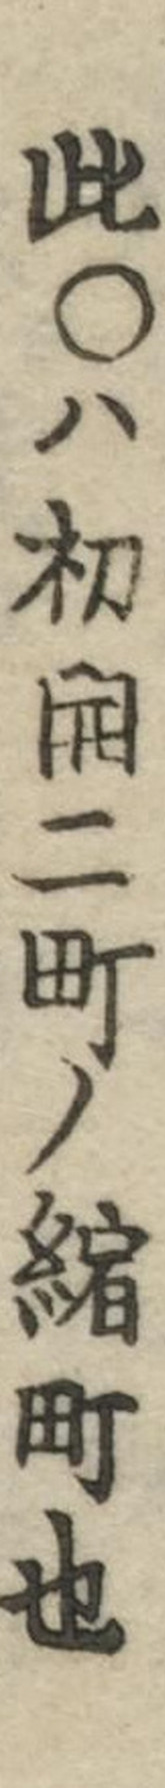此○ハ初開二町ノ縮町也
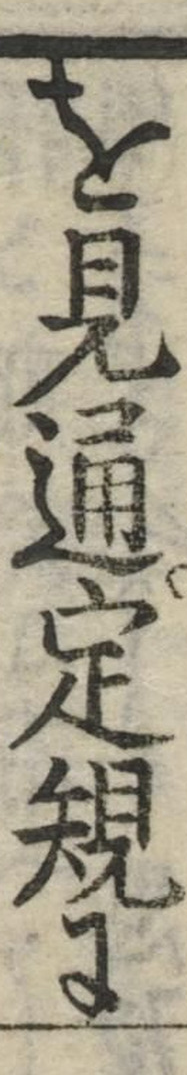を見通。定規に
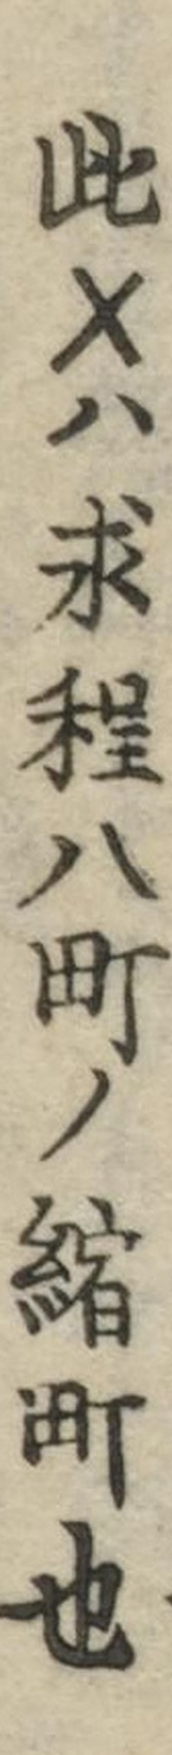此✕ハ求程八町ノ縮町也
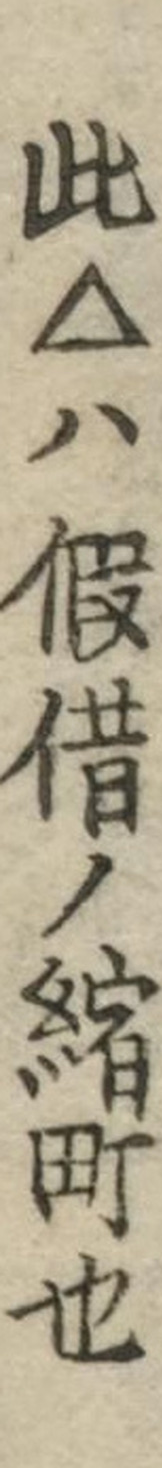此△ハ仮借ノ縮町也
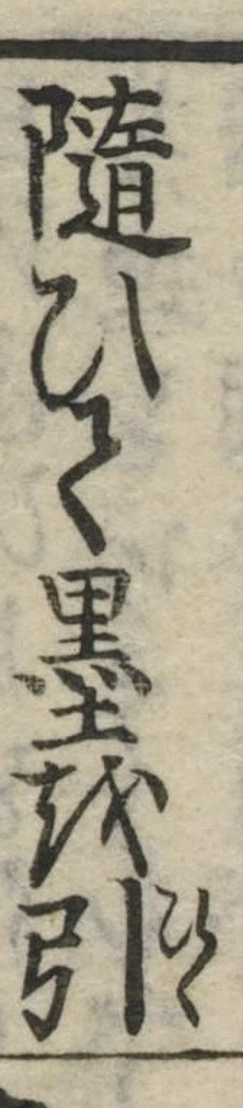随ひて墨を引
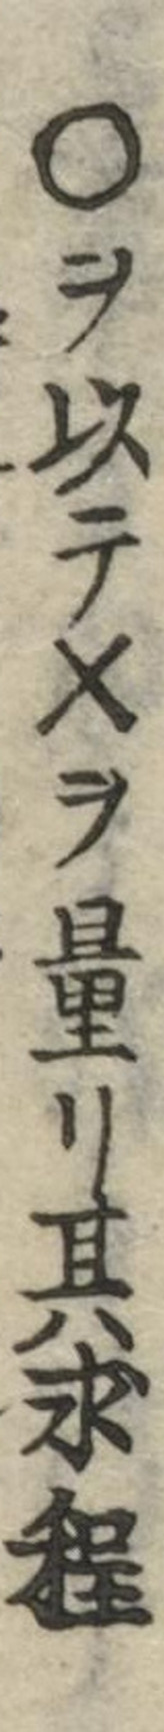○ヲ以テ✕ヲ量リ其求程
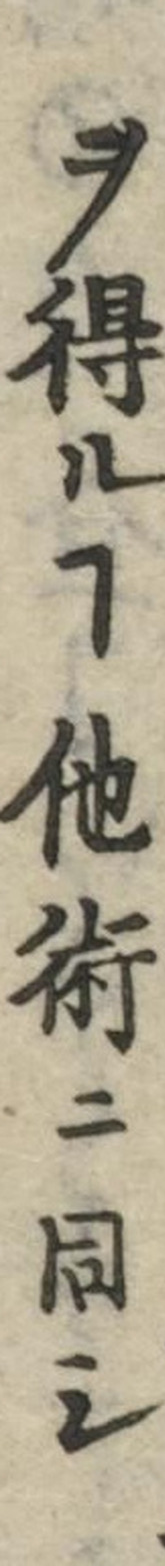ヲ得ルコト他術ニ同シ
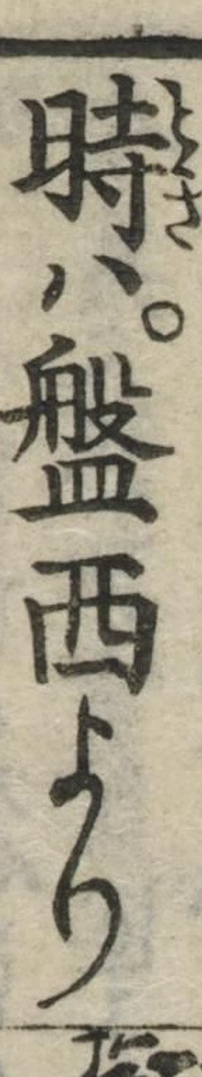時は。盤西より
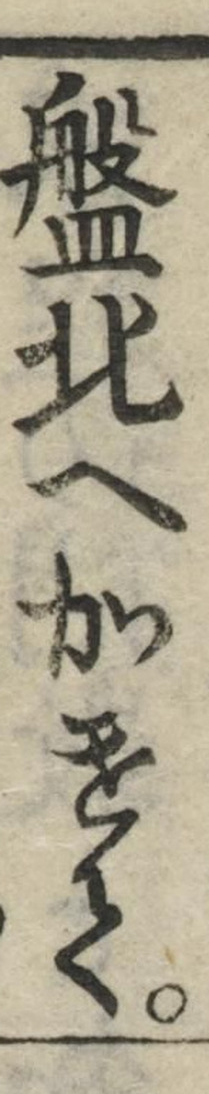盤北へかけて。
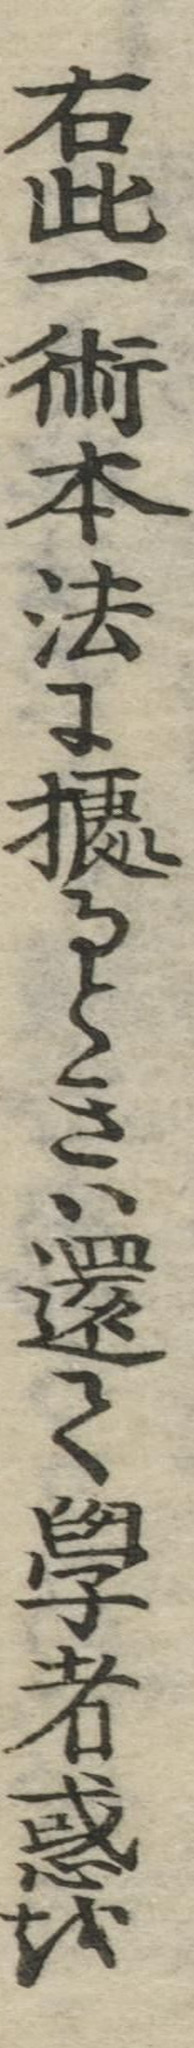右此一術本法に拠るときは還て学者惑を
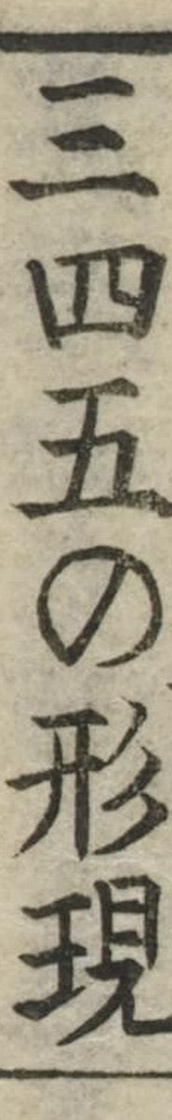三四五の形現
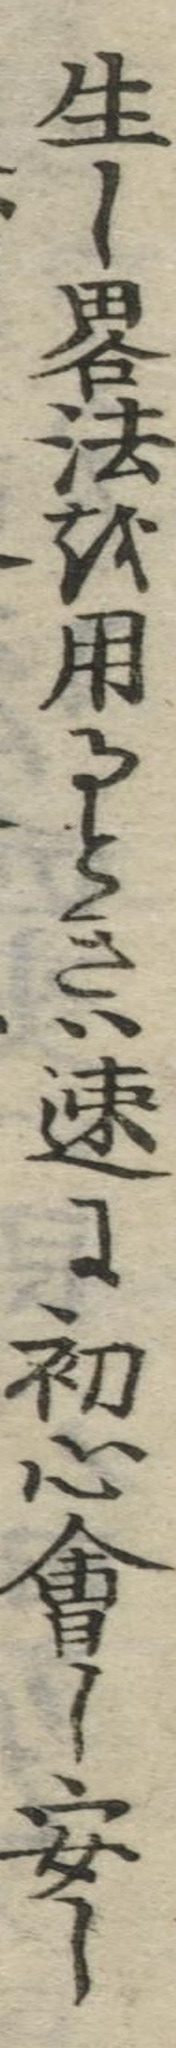生し略法を用るときは速に初心会し安し
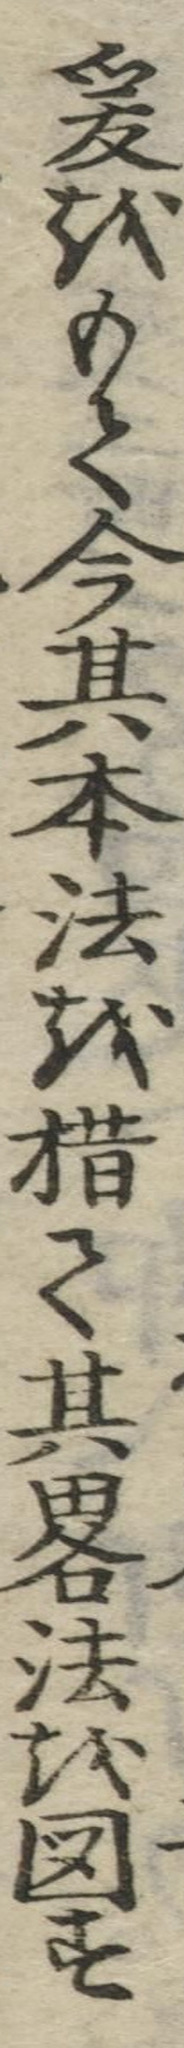爰をもて今其本法を措て其略法を図す
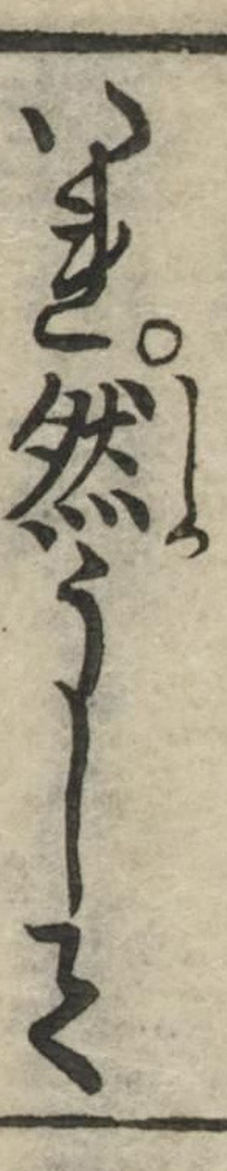はれ。然うして
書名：量地指南　巻之二（内題）
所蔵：東京大学地震研究所図書室 Earthquake Research Institute Library, The University of Tokyo, JAPAN
